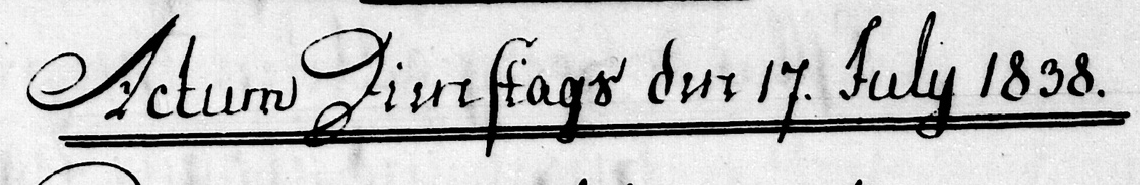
Actum Dienstags den 17. July 1838.
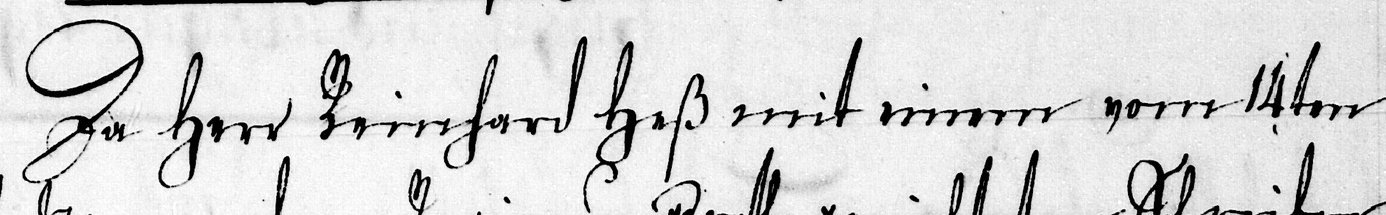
Da Herr Reinhard Heß mit einem vom 14ten
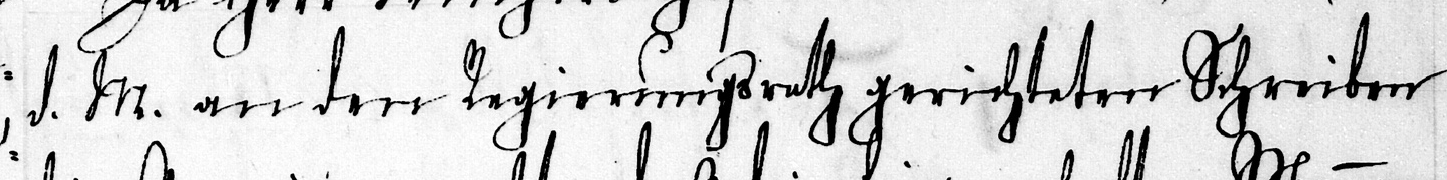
d. M. an den Regierungsrath gerichteten Schreiben
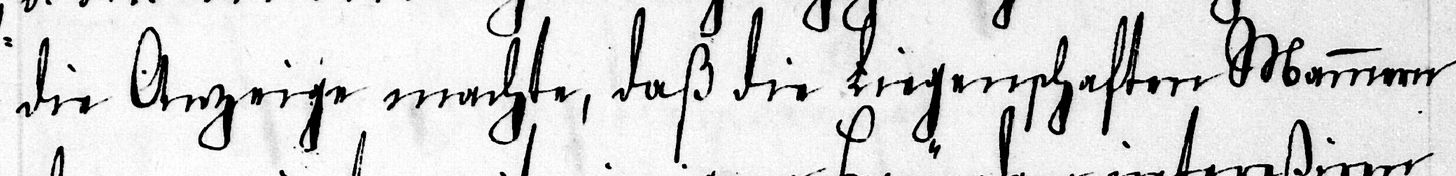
die Anzeige machte, daß die Liegenschaften Mammern
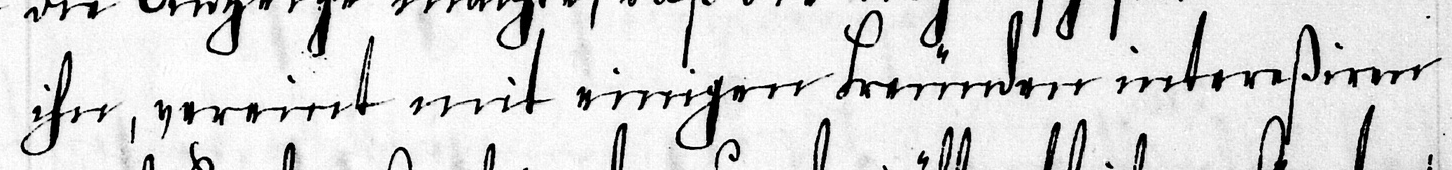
ihn, vereint mit einigen Freunden intereßiren
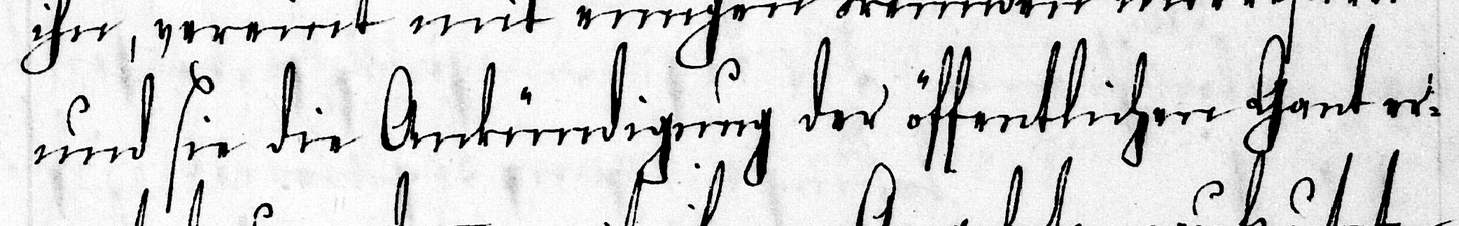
und sie die Ankündigung der öffentlichen Gant er¬
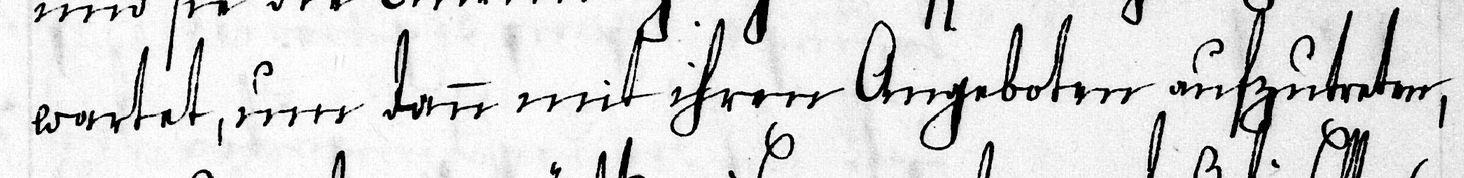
wartet, um dann mit ihren Angeboten aufzutreten,
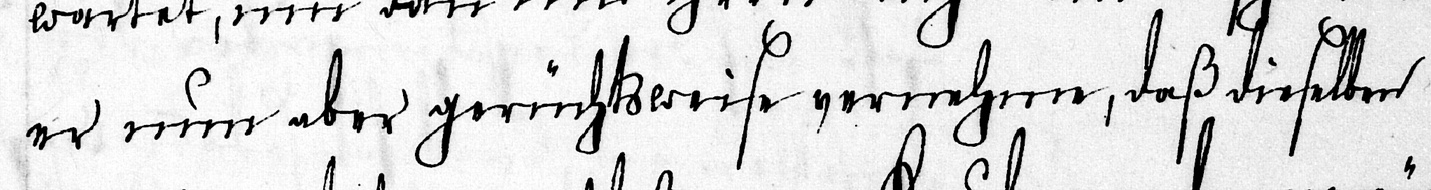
er nun aber gerüchtsweise vernehme, daß dieselben
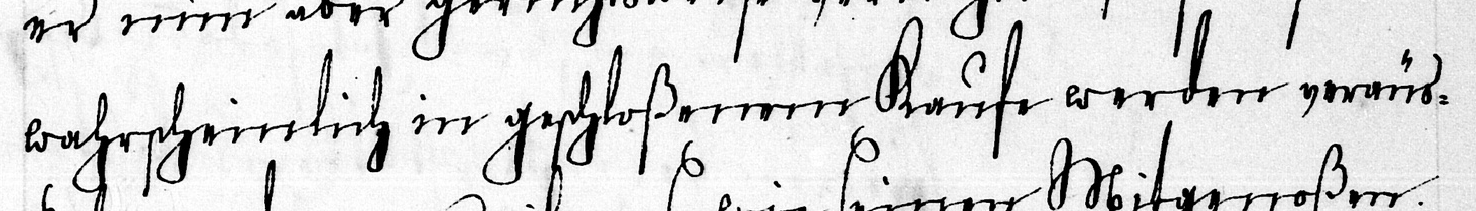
wahrscheinlich in geschloßenem Kaufe werden veräu¬
